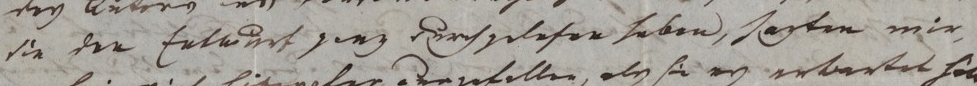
die den Entwurf ganz durchgelesen haben, sagten mir,
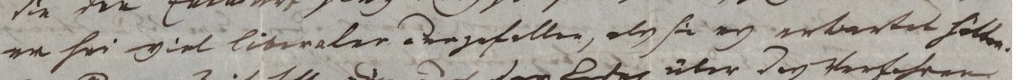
er sei viel liberaler ausgefallen, als sie es erwartet hätten.
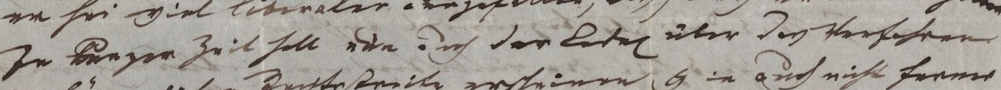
In kurzer Zeit soll nun auch der Codex über das Verfahren
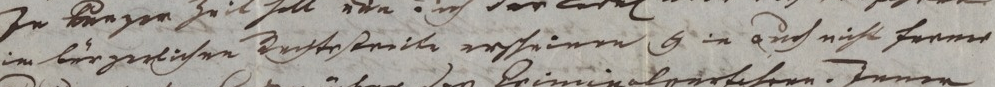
im bürgerlichen Rechtsstreite erscheinen & in auch nicht ferner
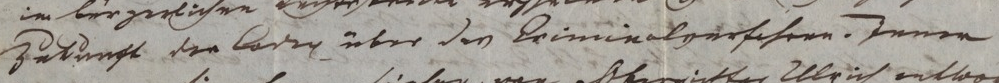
Zukunft der Codex über das Criminalverfahren. Jener
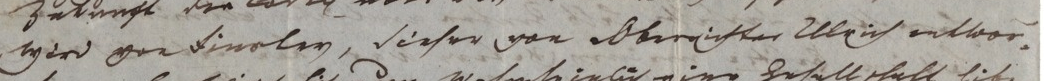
wird von Finsler, dieser von Oberrichter Ulrich entwor-
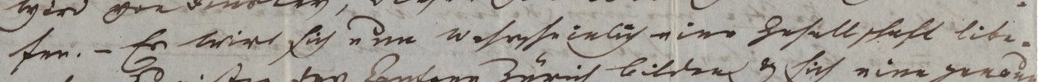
fen. – Es wird sich nun wahrscheinlich eine Gesellschaft libe-
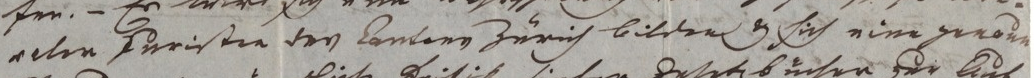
raler Juristen des Cantons Zürich bilden &sich eine genaue
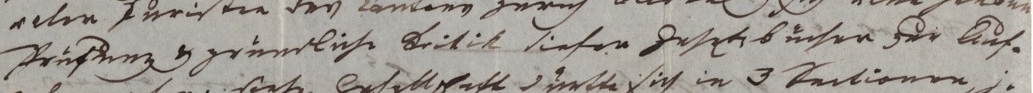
Prüfung & gründliche Kritik dieser Gesetzbücher zur Auf-
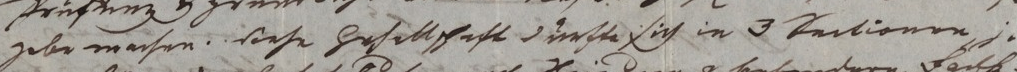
gabe machen. Diese Gesellschaft dürfte sich in 3 Sectionen, je
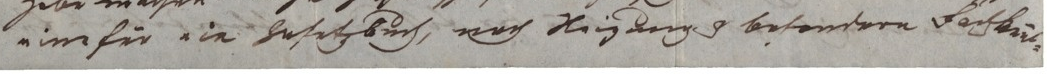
eine für ein Gesetzbuch, nach Neigung & besondern Fachkennt
